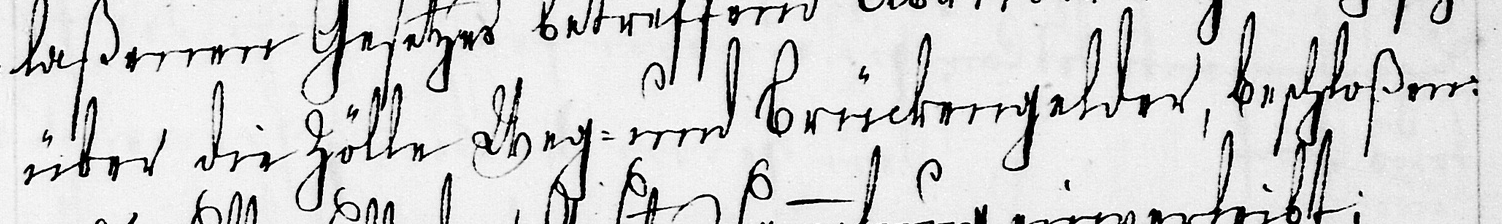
über die Zölle Weg- und Brückengelder, beschloßen:
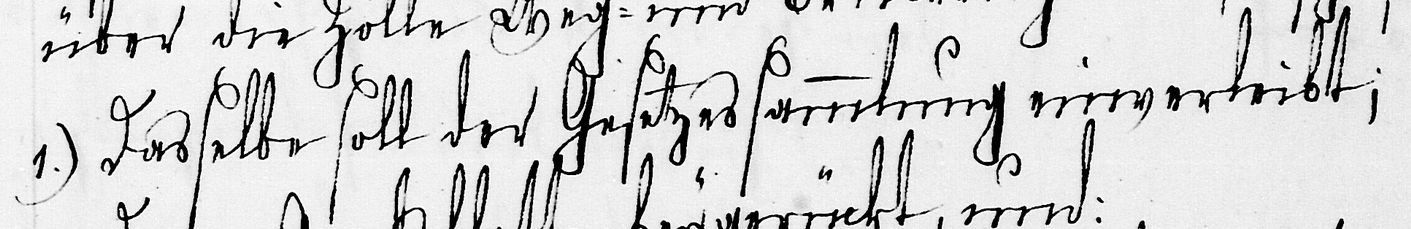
1.) Dasselbe soll der Gesetzessammlung einverleibt;
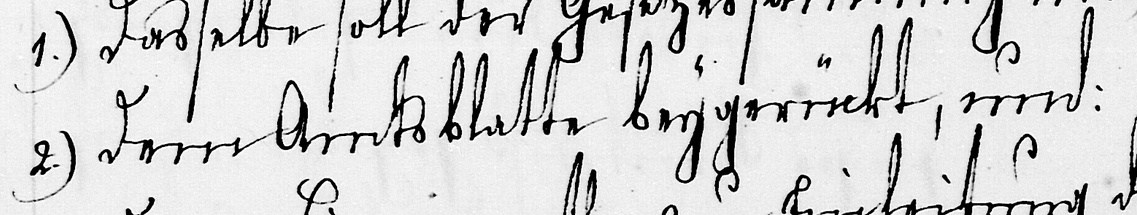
2.) Dem Amtsblatte beygerückt, und:
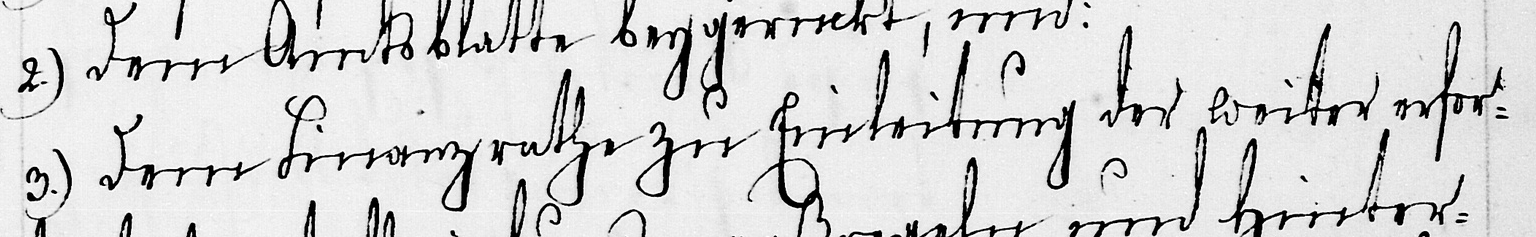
3.) Dem Finanzrathe zu Einleitung der weiter erfor¬
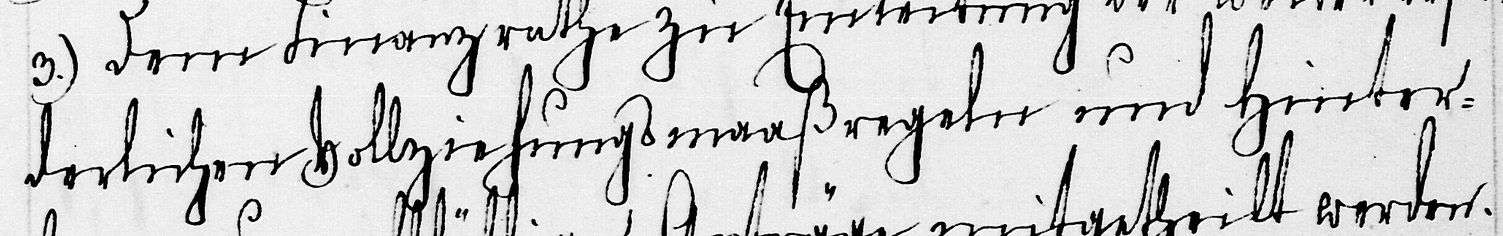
derlichen Vollziehungsmaaßregeln und Hinter¬
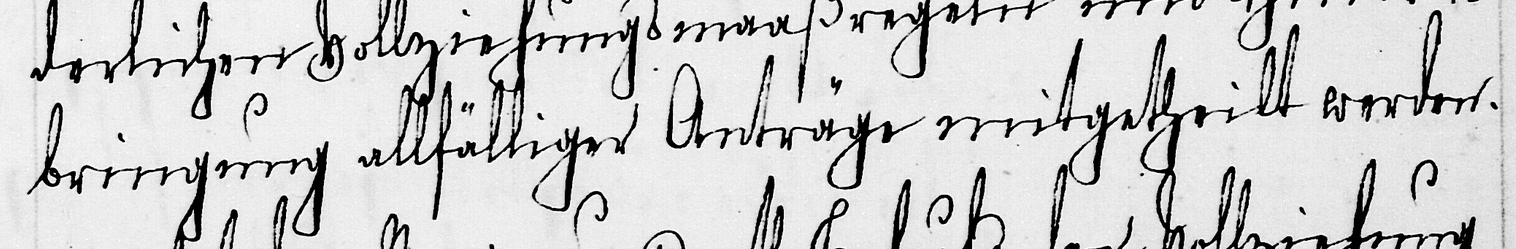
bringung allfälliger Anträge mitgetheilt werden.
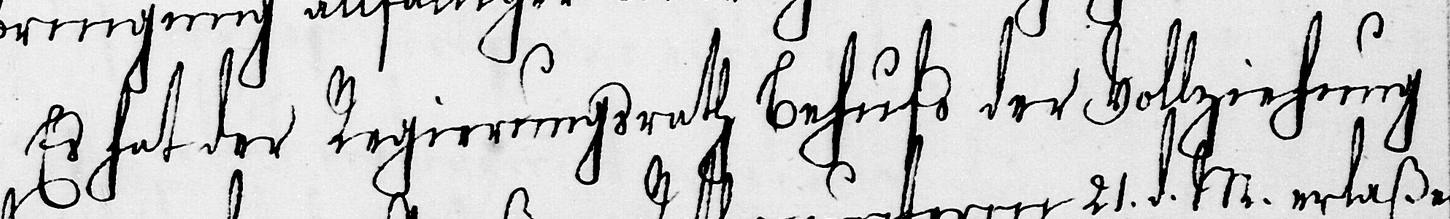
Es hat der Regierungsrath Behufs der Vollziehung
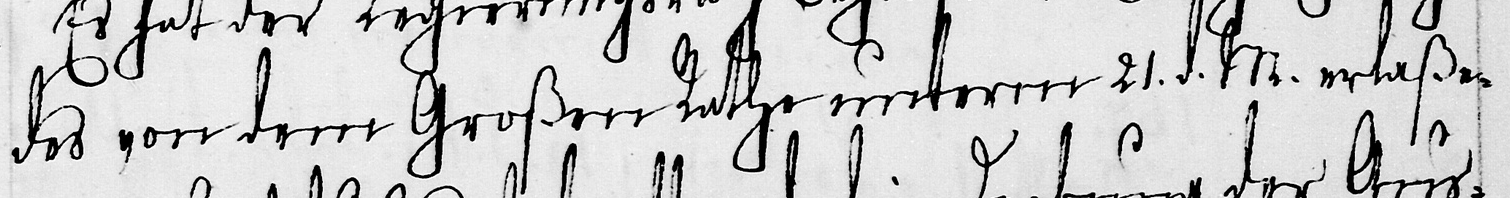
des von dem Großen Rathe unterm 21. d. M. erlaße¬
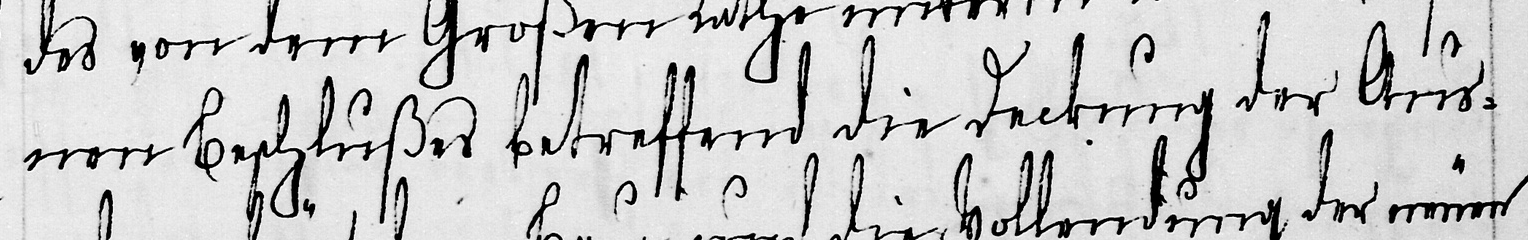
nen Beschlußes betreffend die Deckung der Aus¬
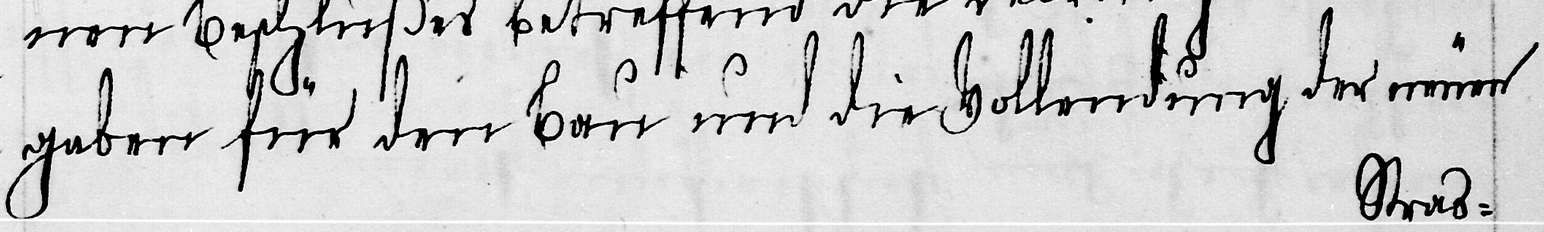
gaben für den Bau und die Vollendung der neuen
